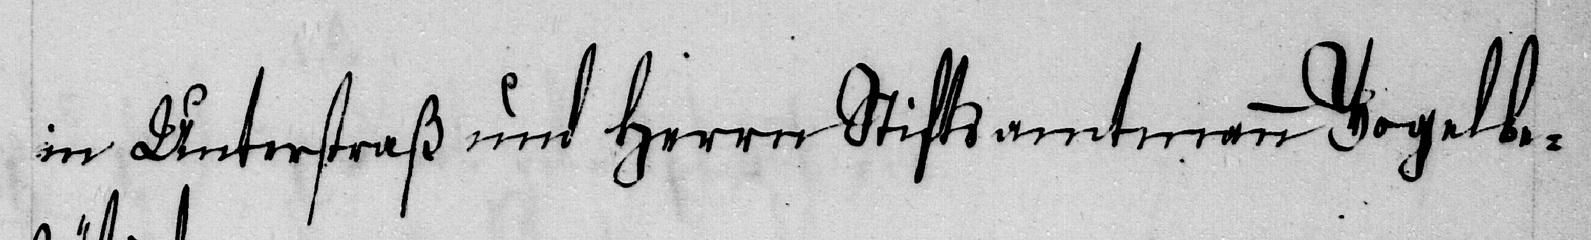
in Unterstraß und Herrn Stiftsamtmann Vogel be¬
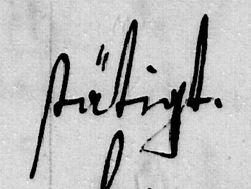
stätigt.
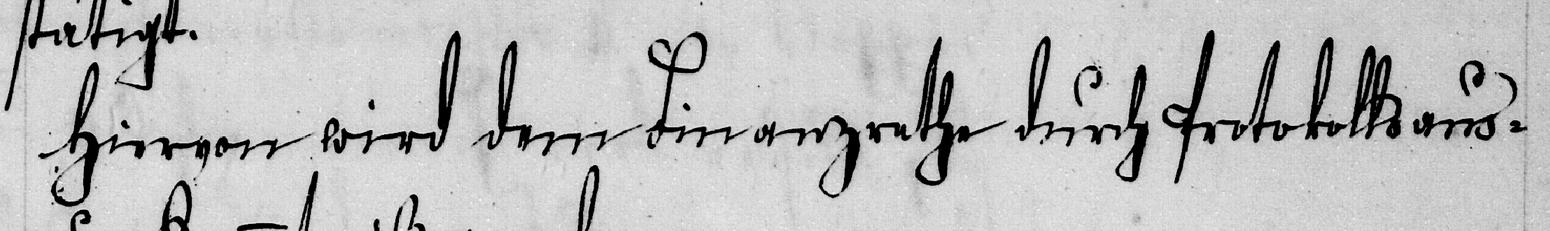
Hiervon wird dem Finanzrathe durch Protokollsaus¬
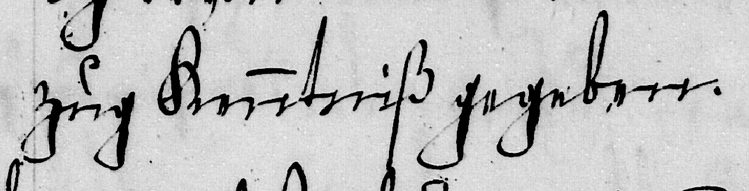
zug Kenntniß gegeben.
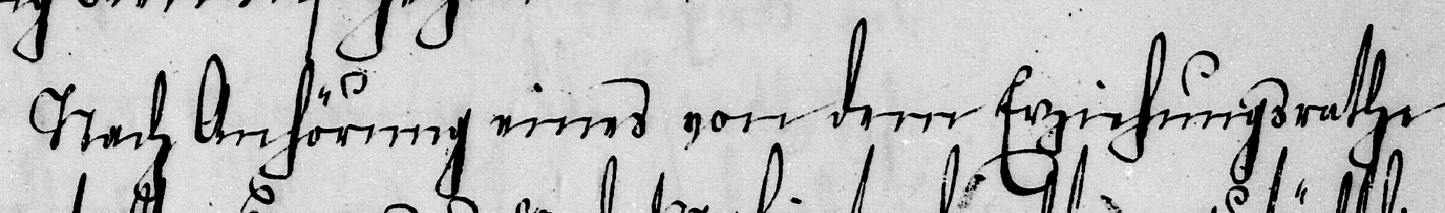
Nach Anhörung eines von dem Erziehungsrathe
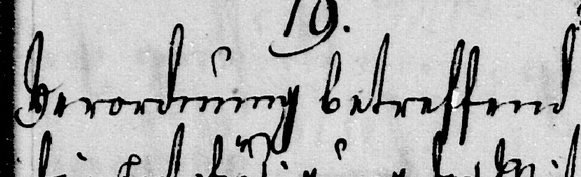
Berichtes, betreffend
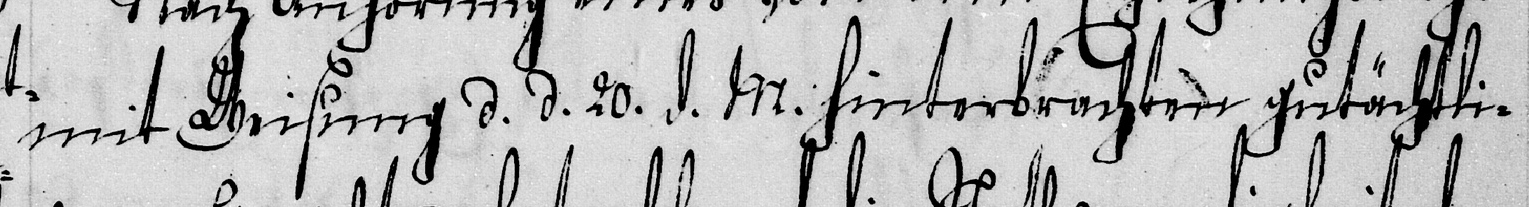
mit Weisung d. d. 20. d. M. hinterbrachten gutächtli¬
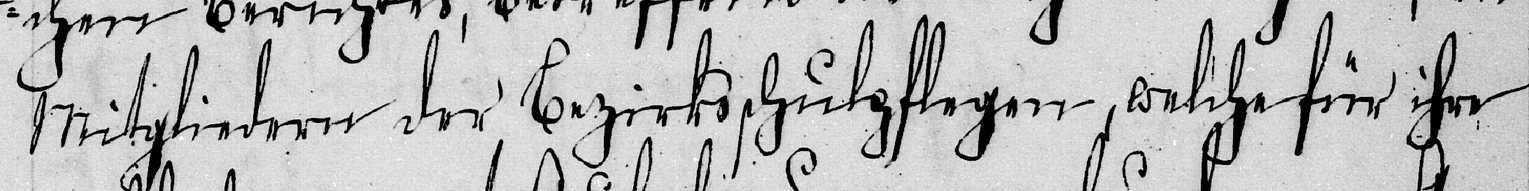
Mitgliedern der Bezirksschulpflegen, welche für ihre
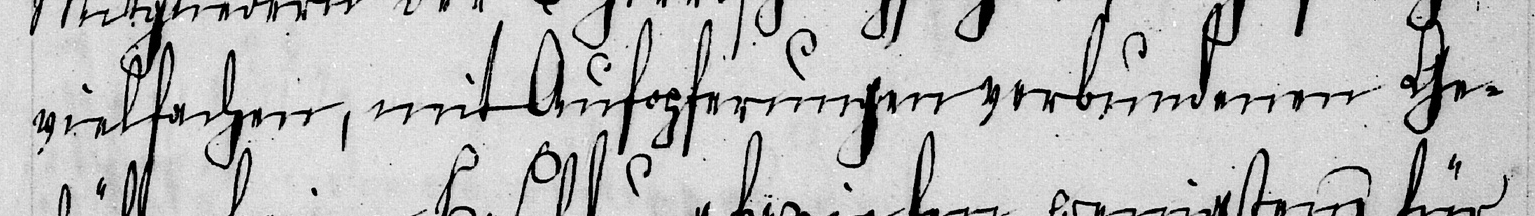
vielfachen, mit Aufopferungen verbundenen Ge¬
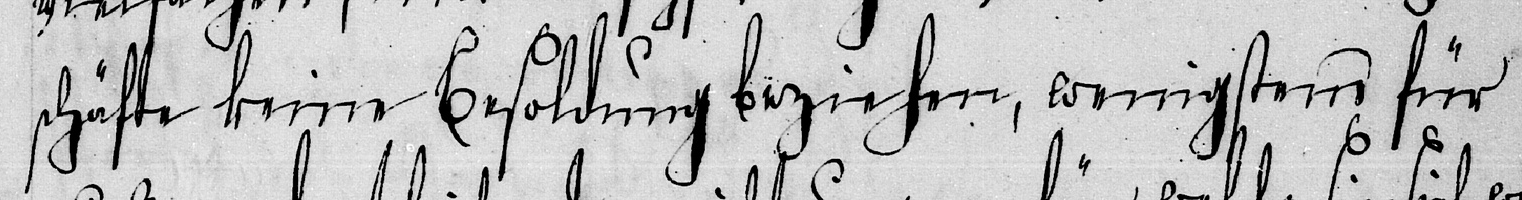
schäfte keine Besoldung beziehen, wenigstens für
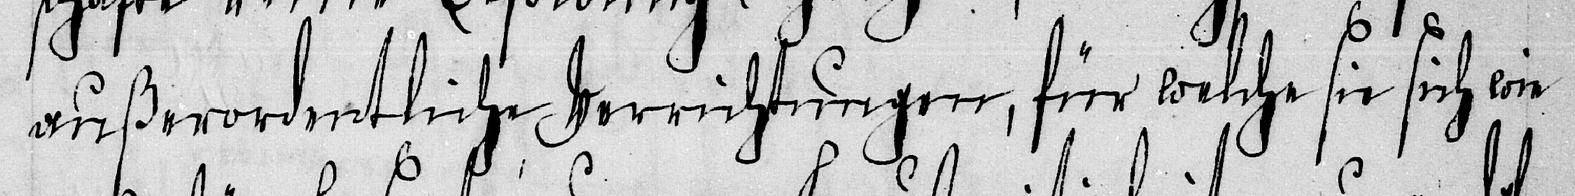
außerordentliche Verrichtungen, für welche sie sich wie
